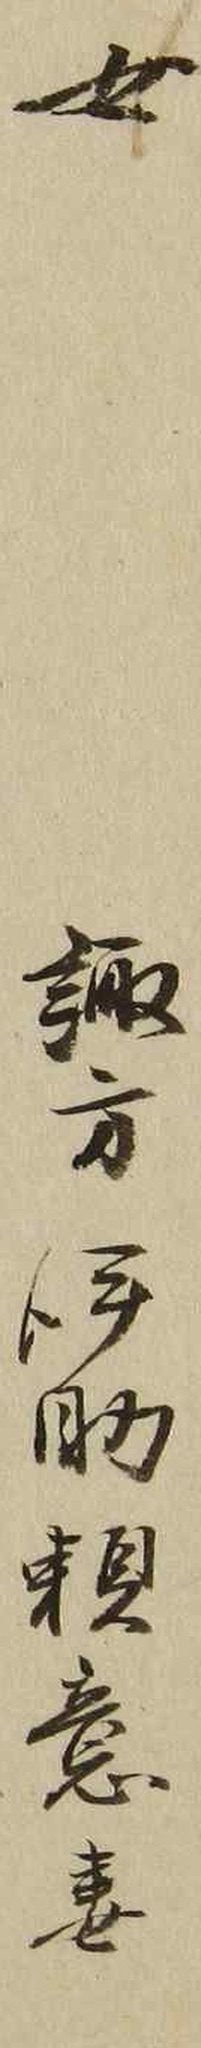女諏方伊助頼意妻
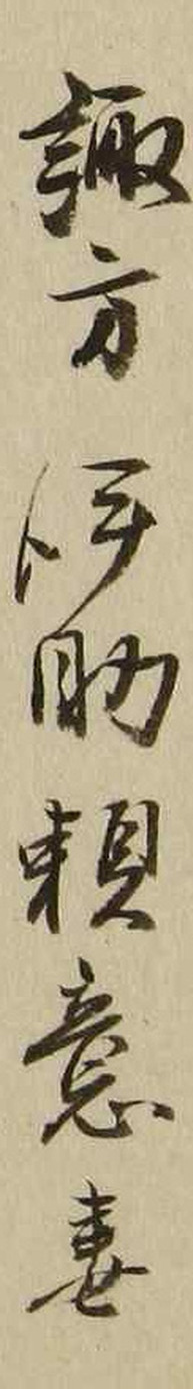女諏方伊助頼意妻
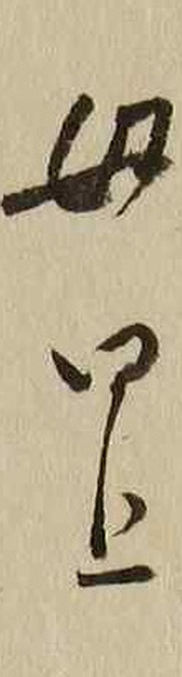母同上
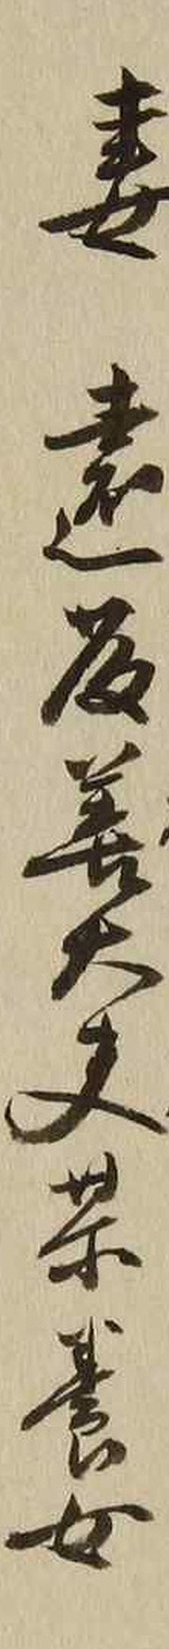遠藤善太夫某養女
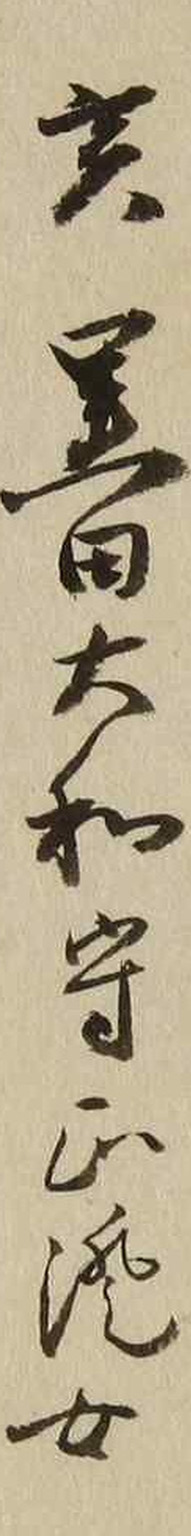実黒田大和守政澄女
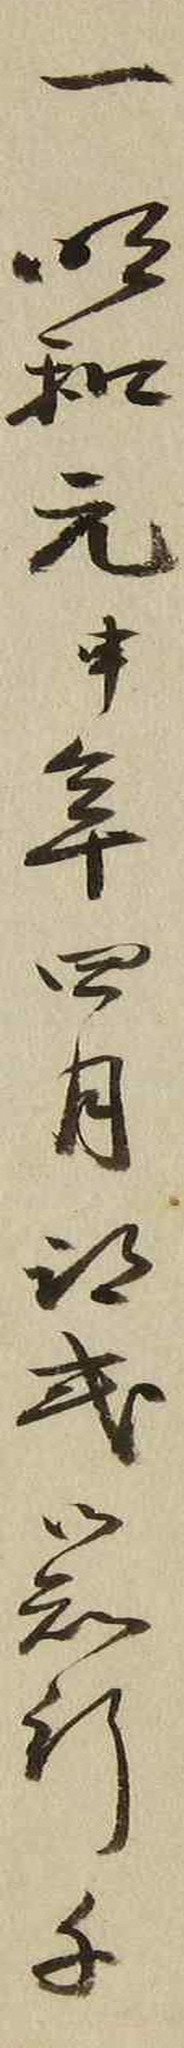一明和元申年四月跡式御知行千
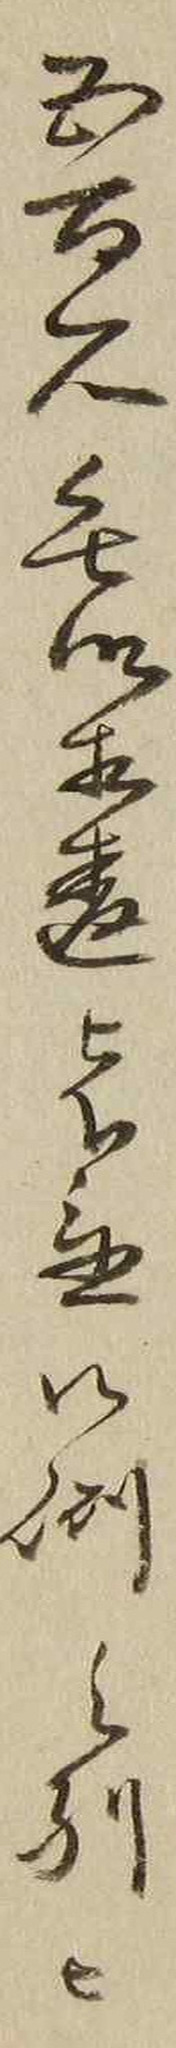五百石無御相違被下置御側之列被
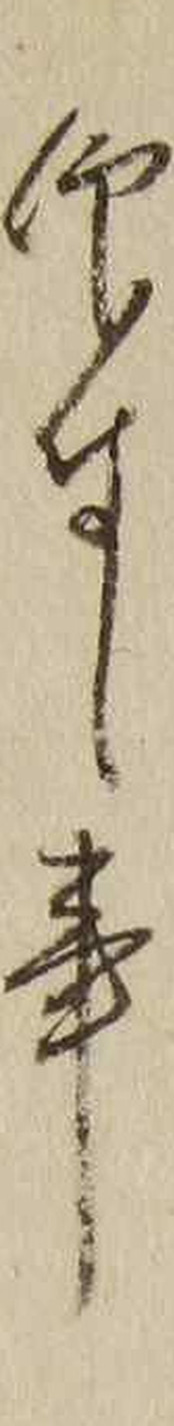仰付候事
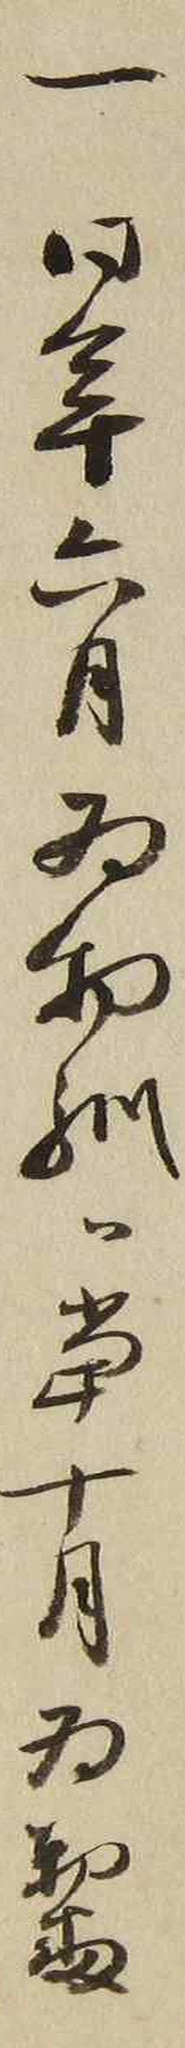一同年六月為物馴候当十月為勤番
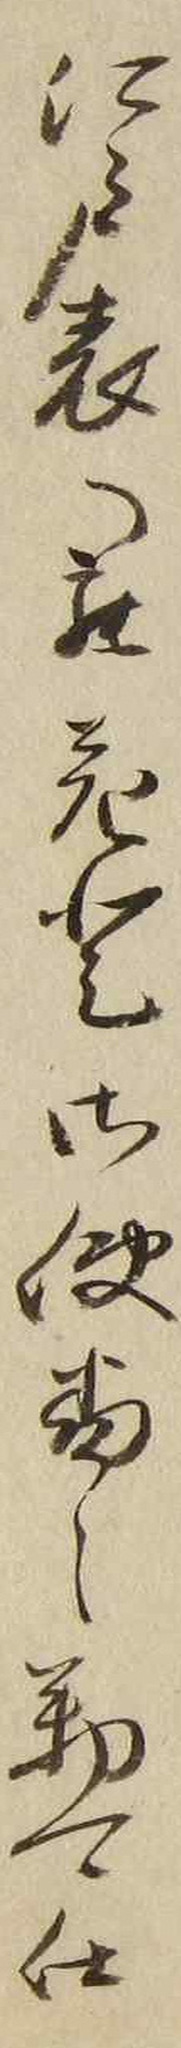江戸表へ罷差登御使番之勤可仕
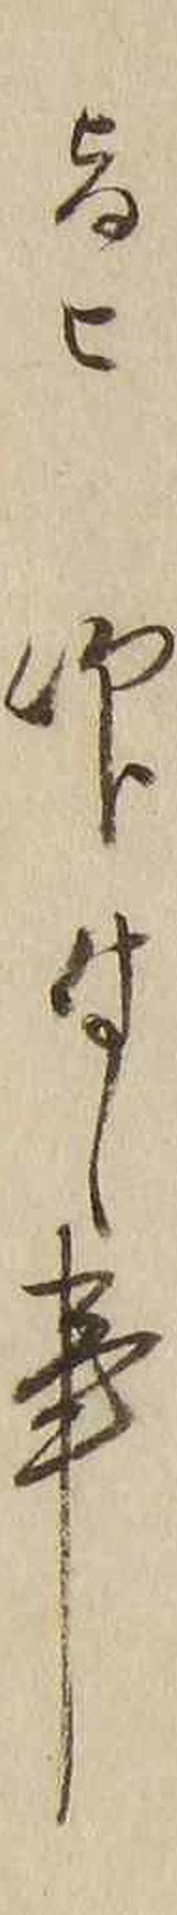旨被仰付候事
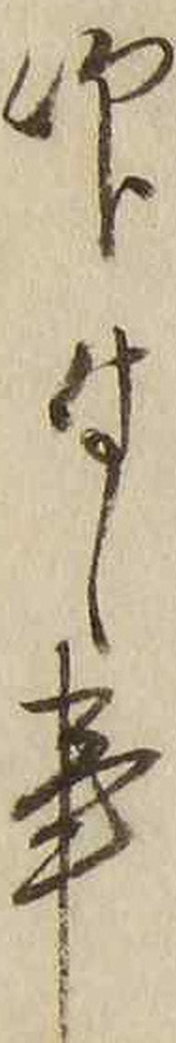仰付候事

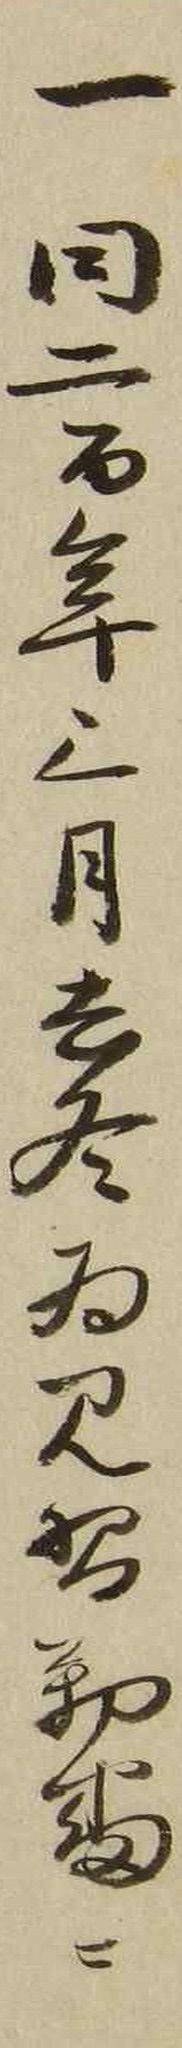一同二酉年三月去冬為見習勤番被
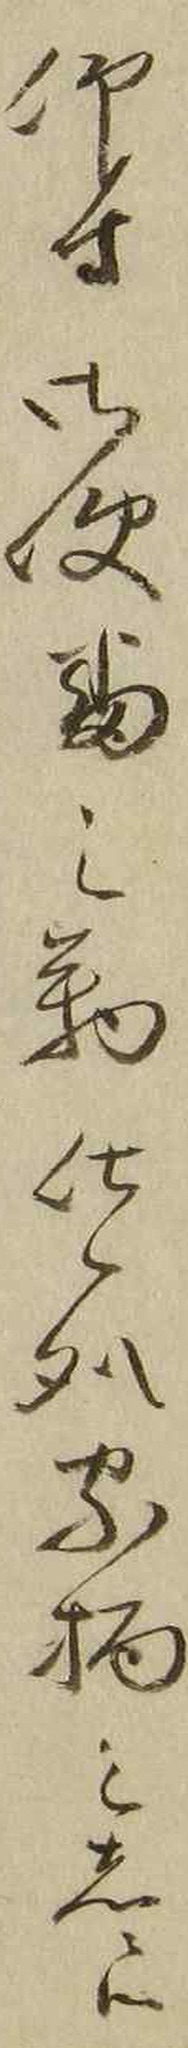仰付御使番之勤仕候処家柄之者に候
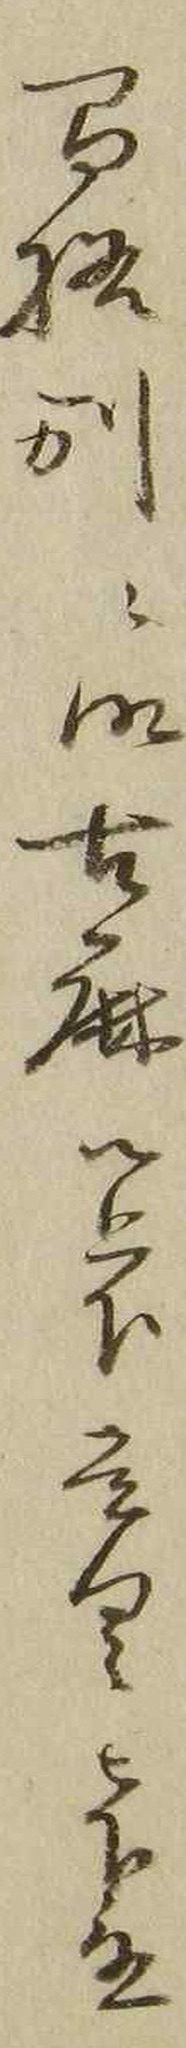間各別に御古麻御上下壱具被下置
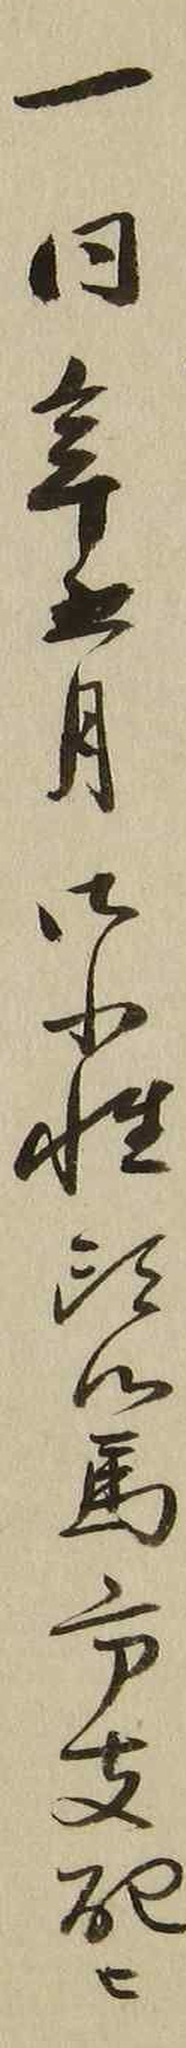一同年五月御小姓頭御馬支配被
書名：諸士系譜　巻之269　さ之部1
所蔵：会津若松市立会津図書館
